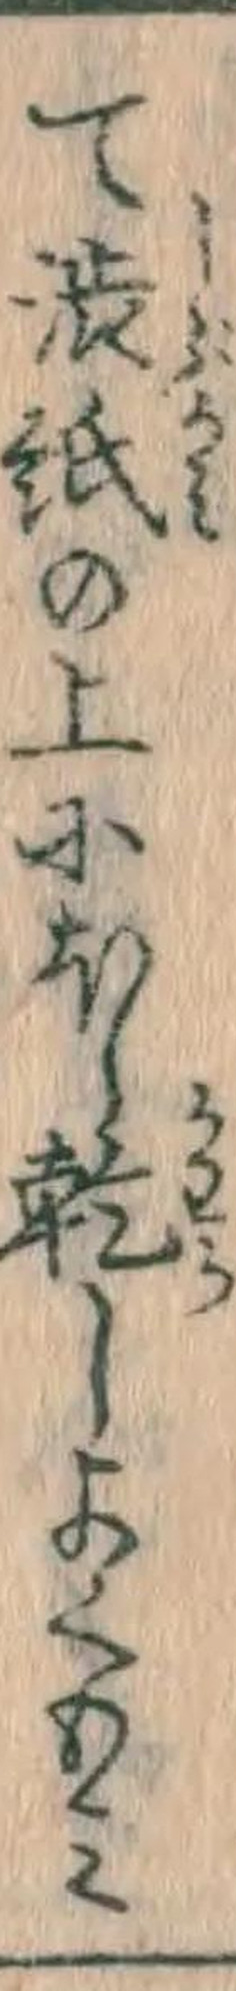て渋紙の上にほし乾しよくもみ
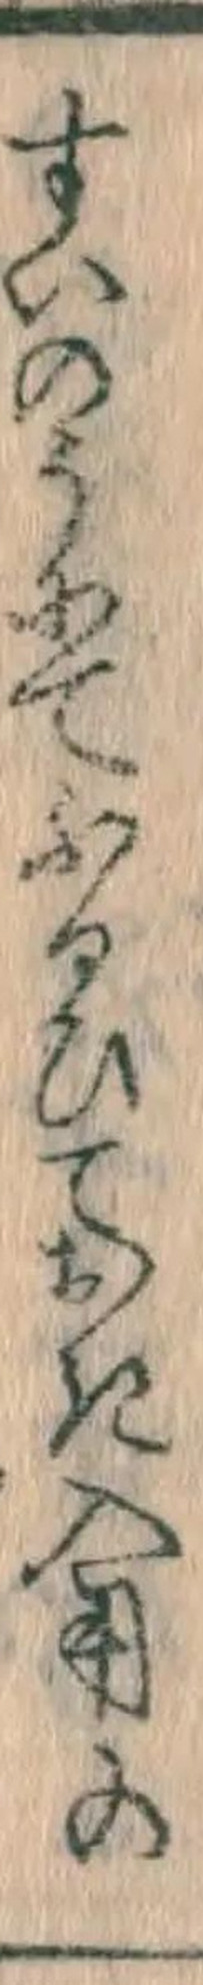すいのうにてふるひておき入用の
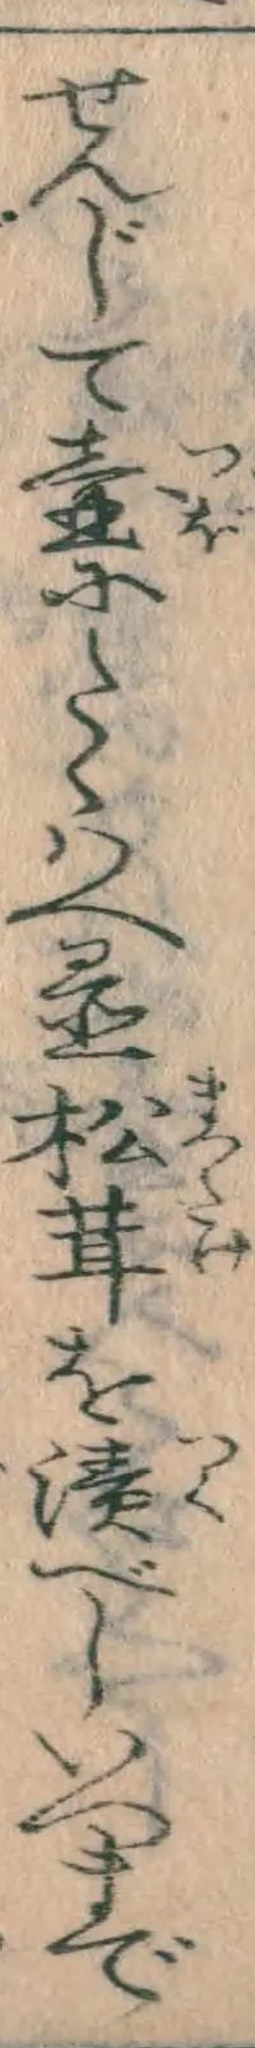せんじて壺にたくはへ置松茸を漬べしいつまで
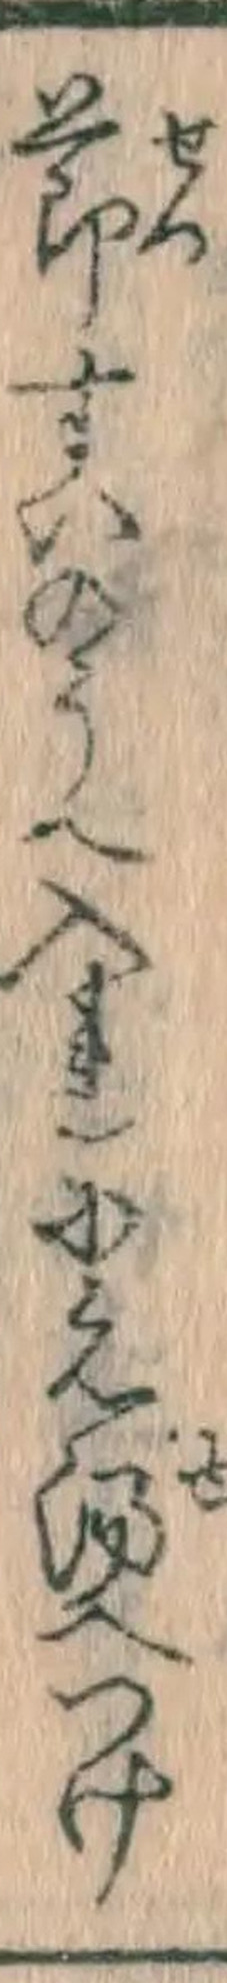節すいのうへ入れにえ湯へつけ
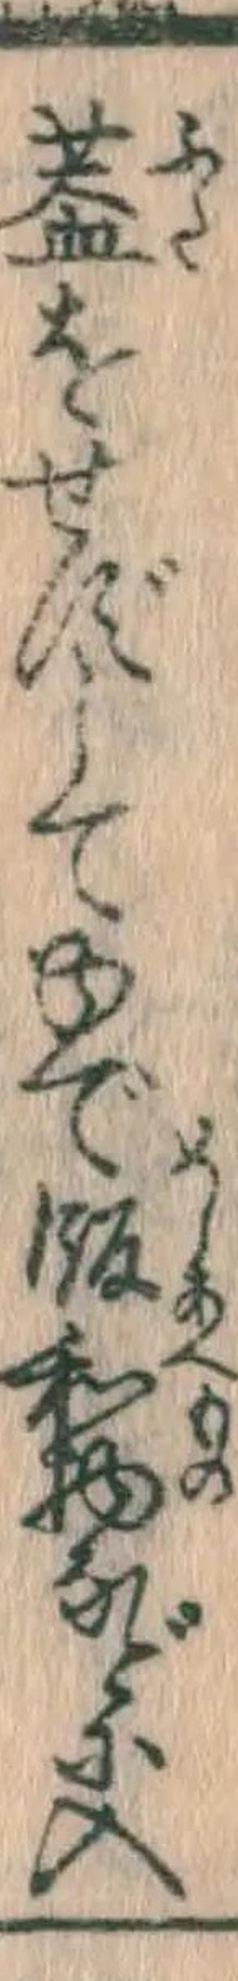蓋をせずしてゆで飯和物などに入
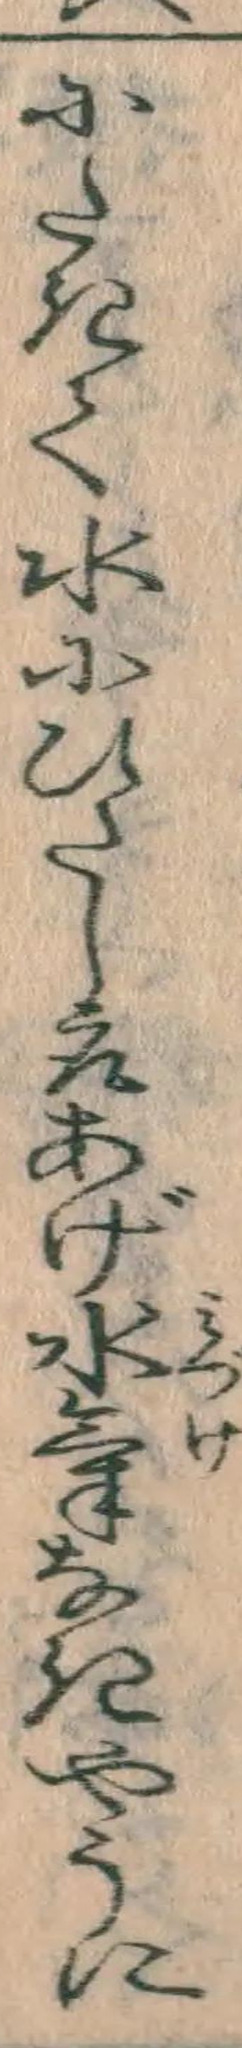にたきて水にひたし取あげ水気なきやうに
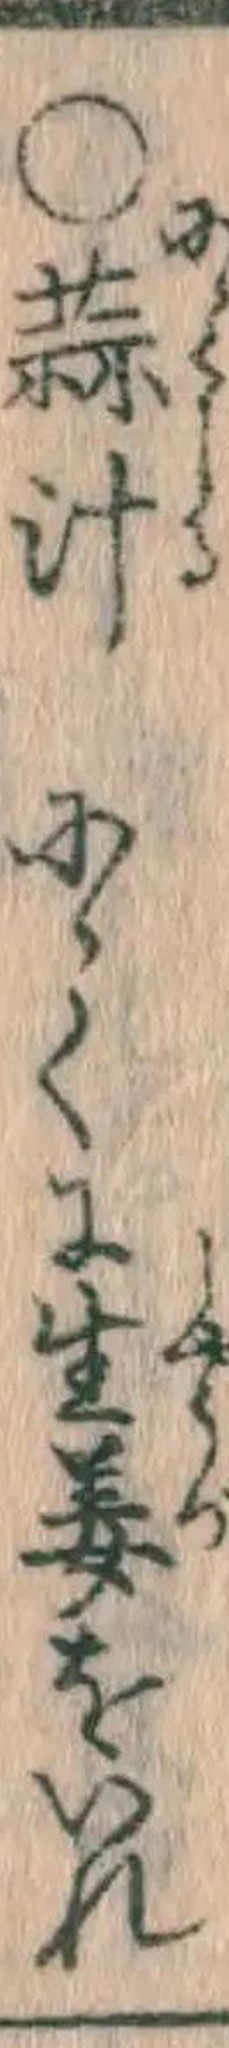○蒜汁にゝくに生姜をいれ
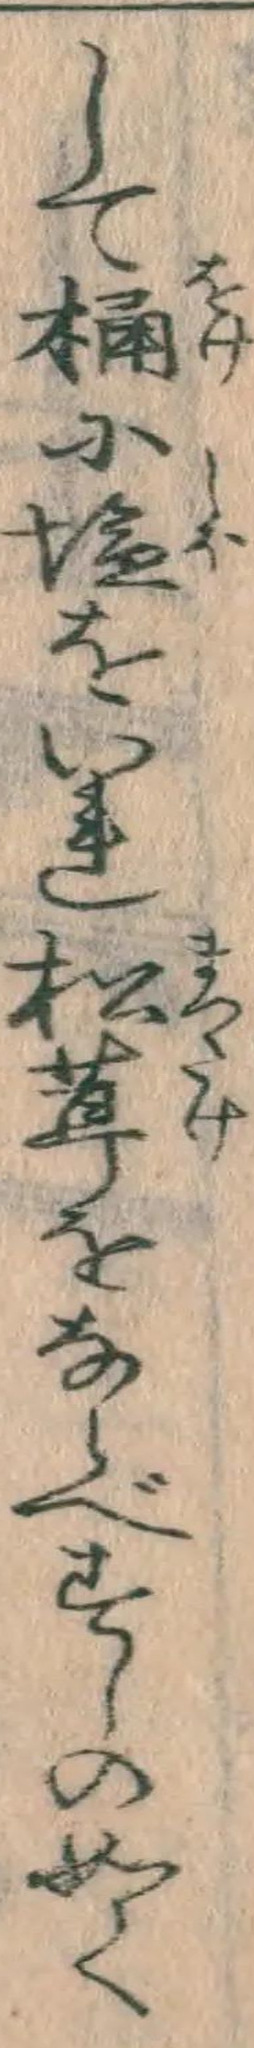して桶に塩をいれ松茸をならべすしの如く
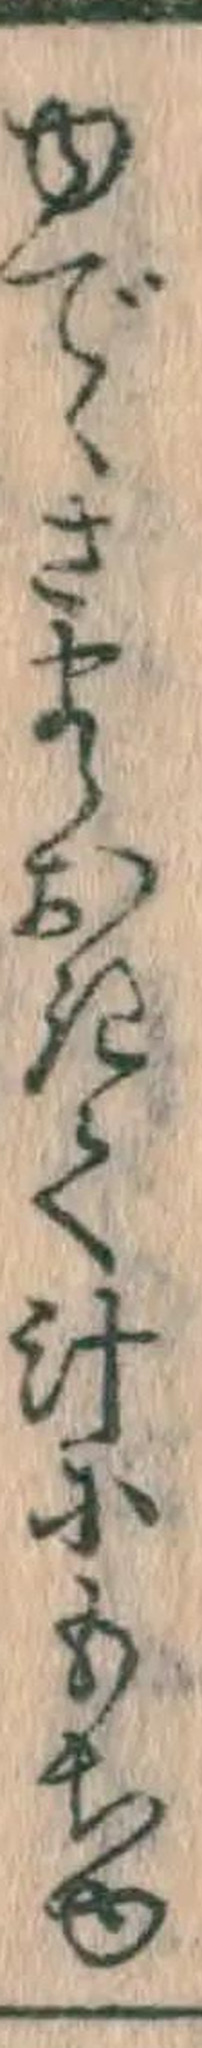ゆでゝさましおきて汁にもちゆ
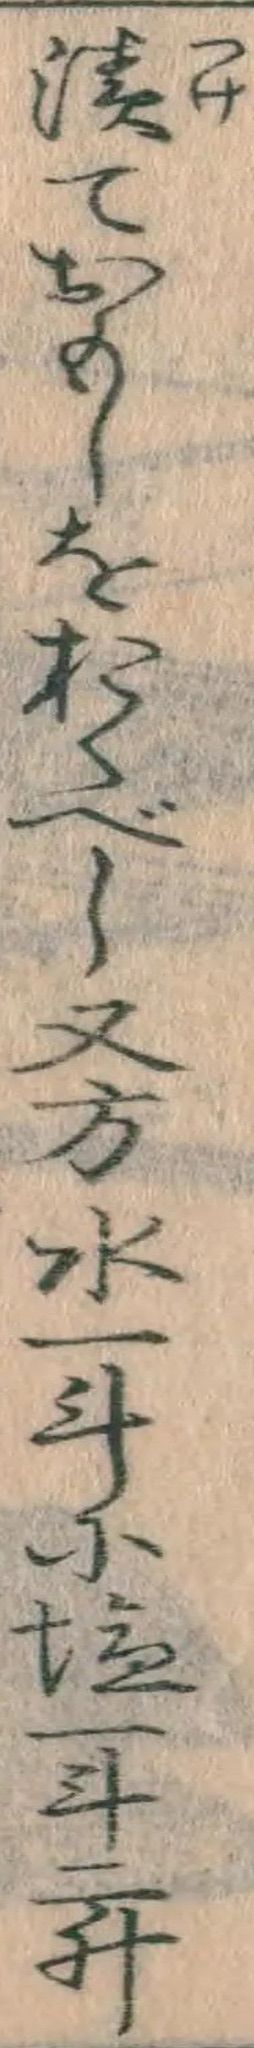漬ておもしをおくべし又方水一斗に塩一斗二升
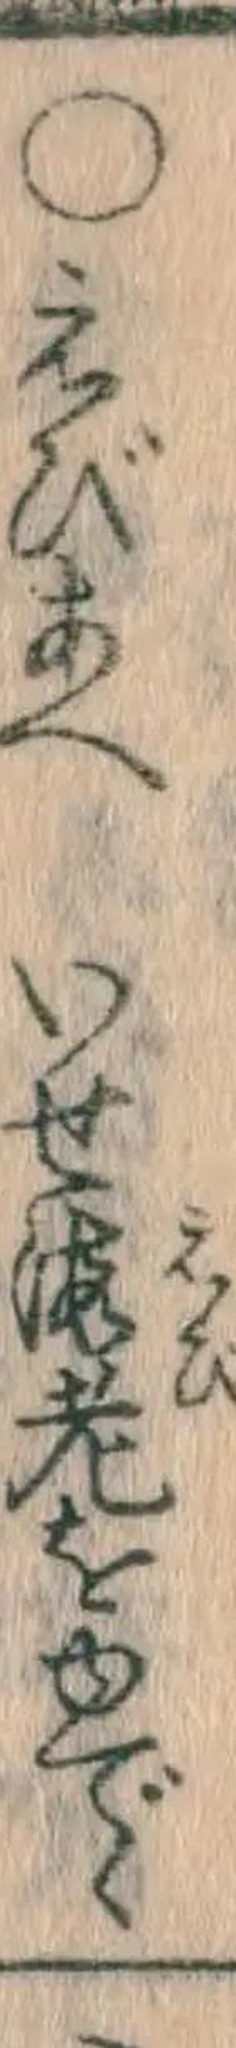○えびあへいせ海老をゆでゝ
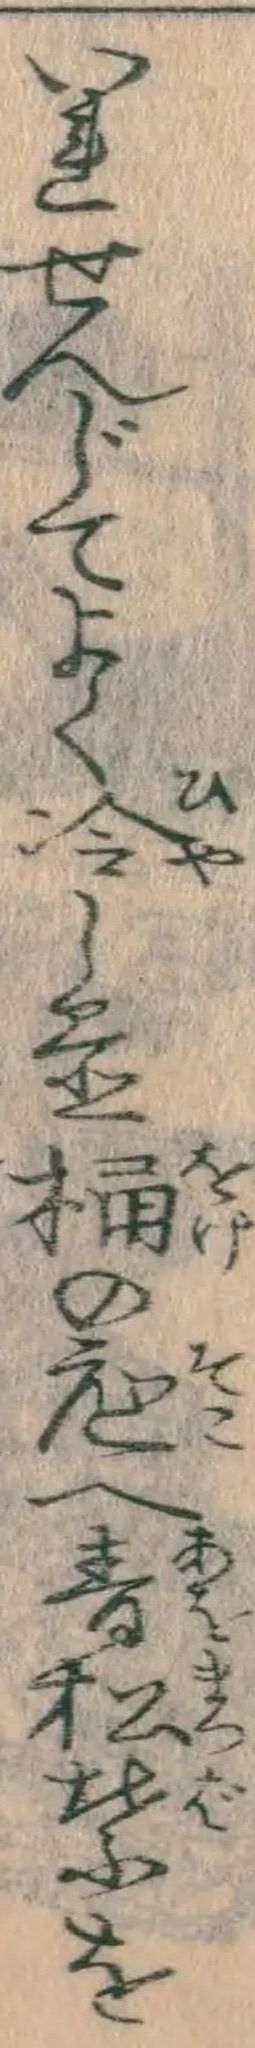いれせんじてよく冷し置桶の底へ青松葉を
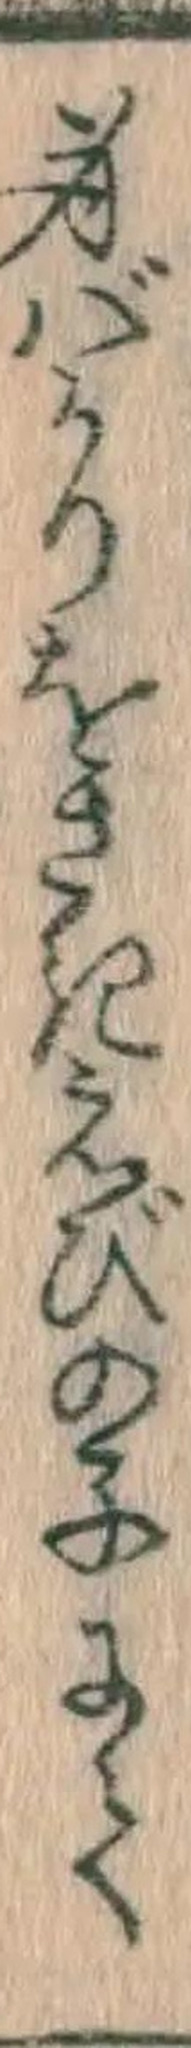身ばかりをさきえびの子にて
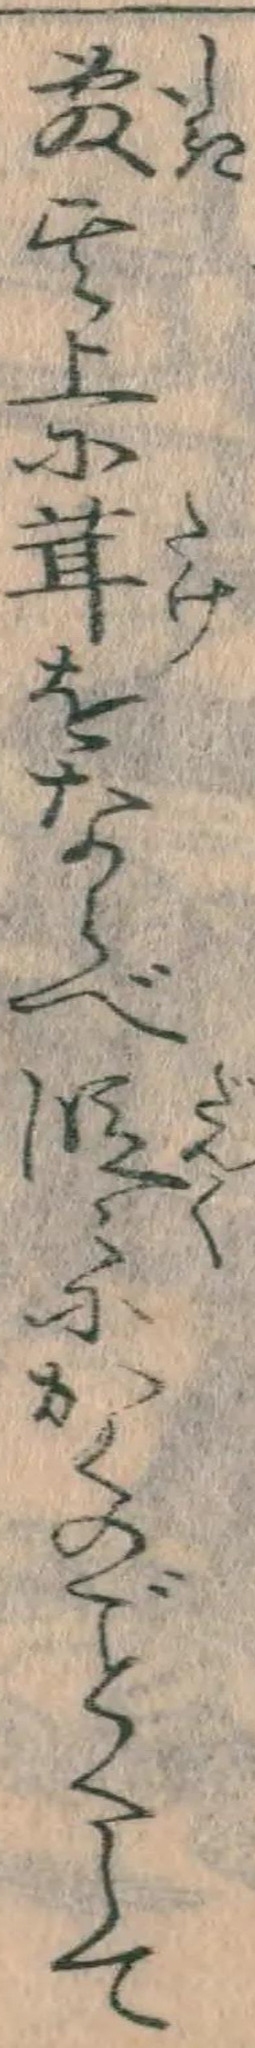敷其上に茸をならべ段々にかくのごとくして
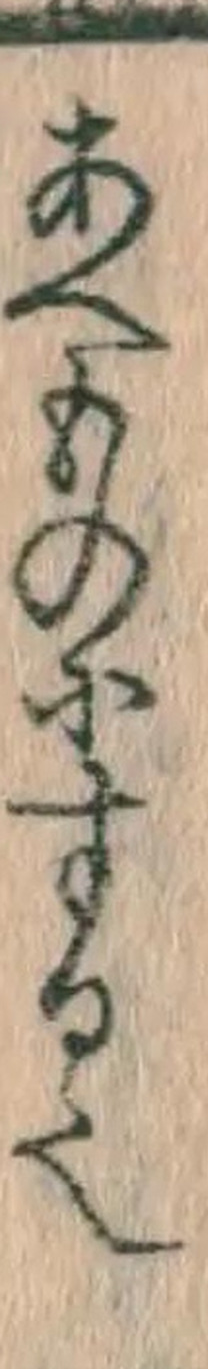あへものにする也
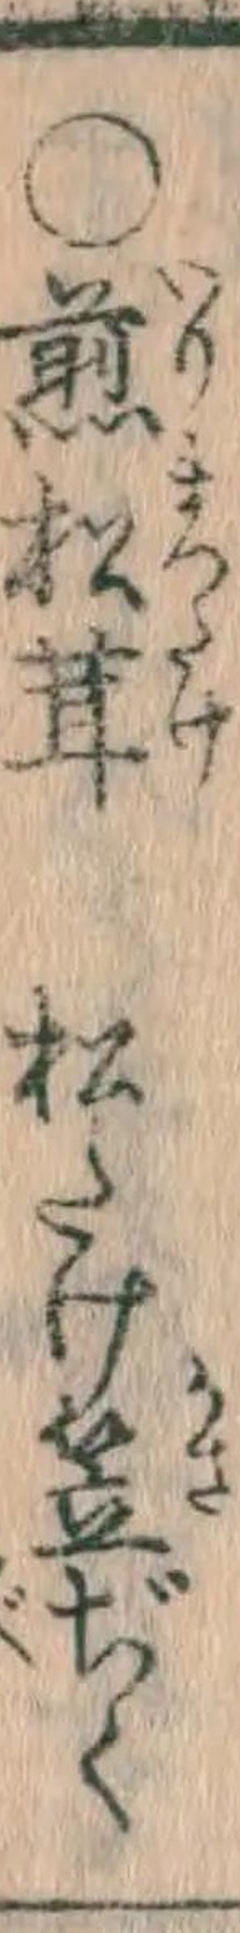○煎松茸松たけ笠ぢく
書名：広益秘事大全 3巻. [5]
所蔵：国立国会図書館 National Diet Library, JAPAN
